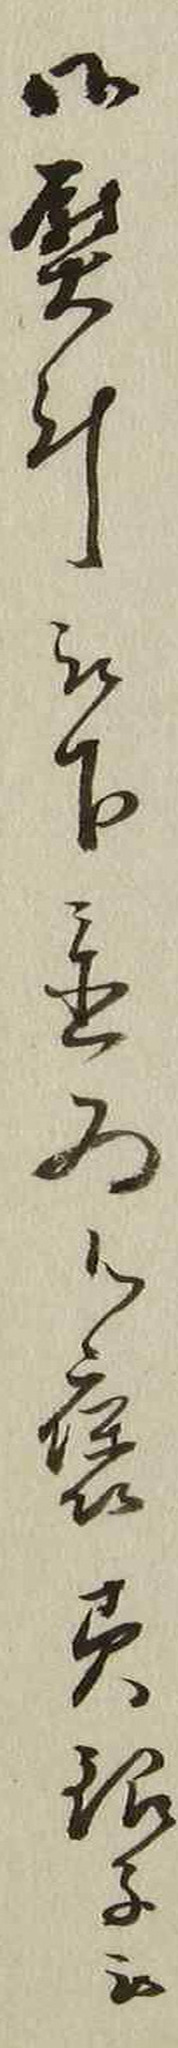御熨斗被下置為御褒美銀子被
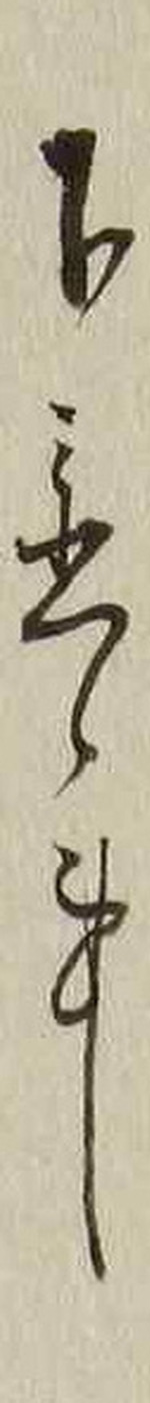下置候事
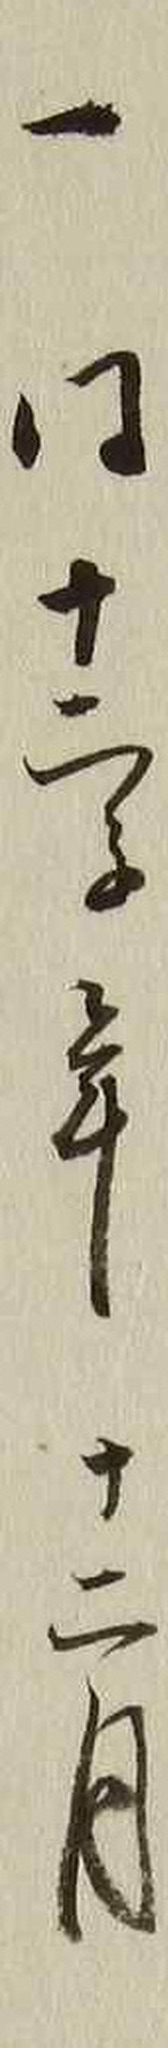一同十二子年十二月
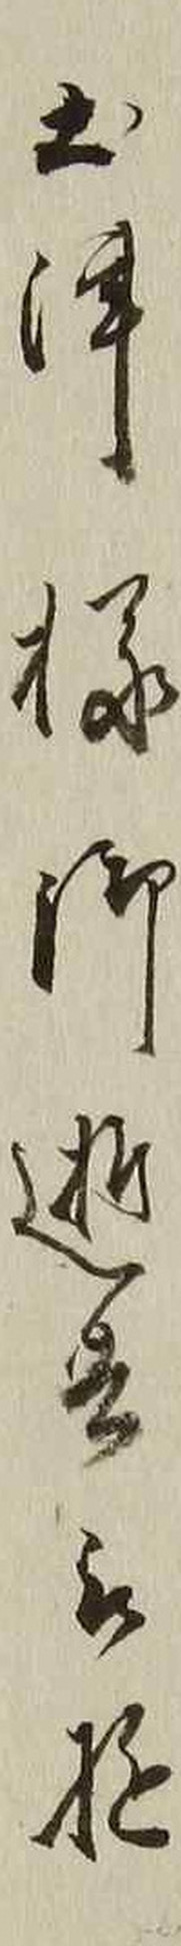土津様御逝去被遊
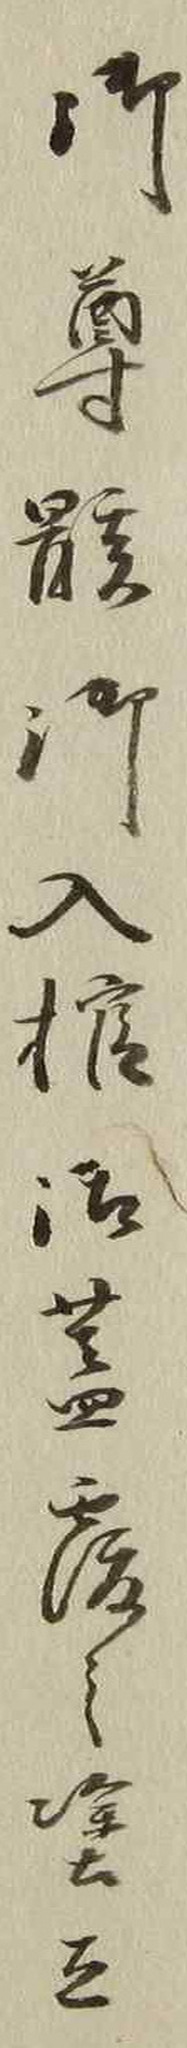御尊骸御入棺御蓋覆之塗立
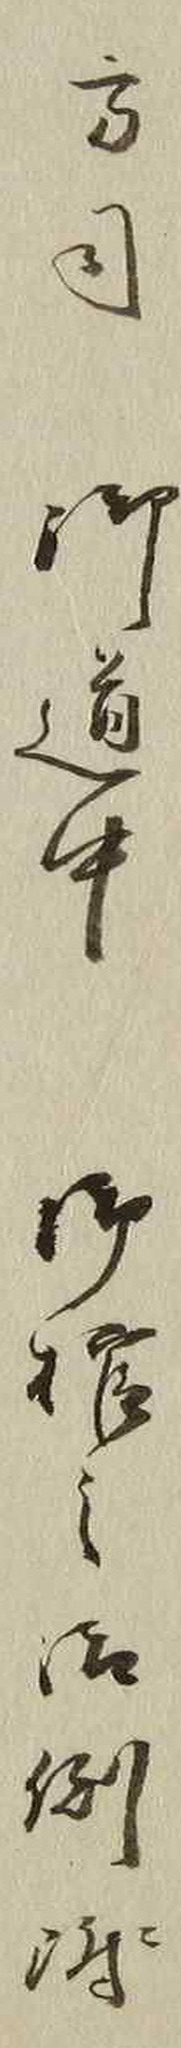方司御道中御棺之御側ニ附
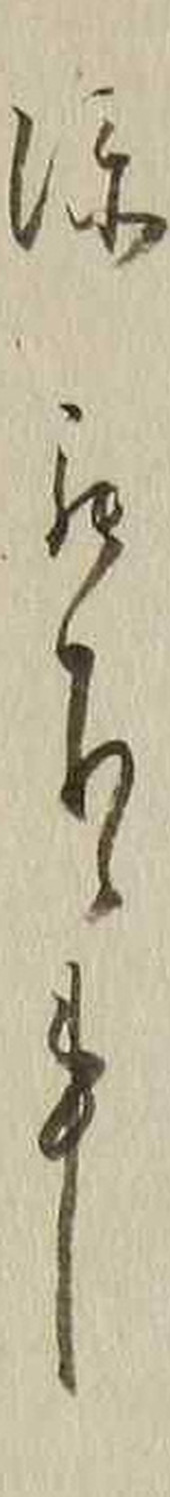添罷下候事
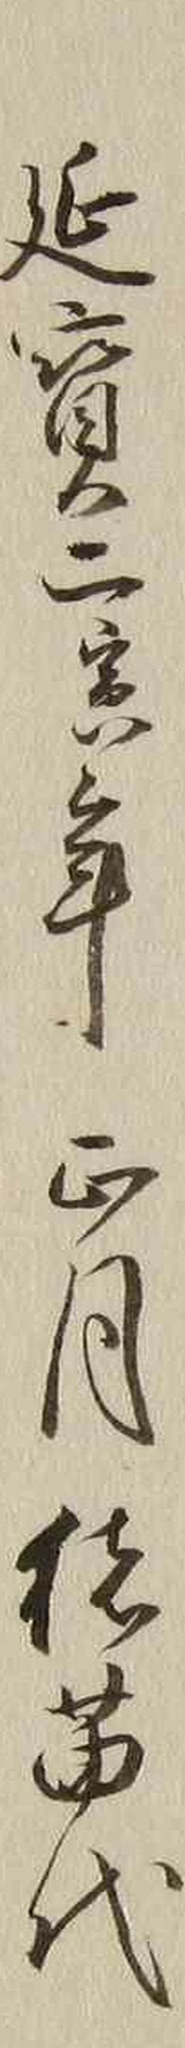一延宝二寅年正月猪苗代
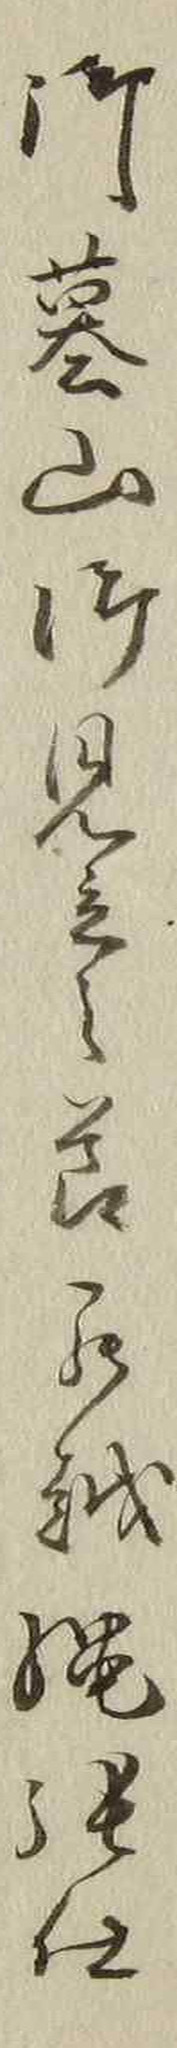御墓山御見立之節罷越縄張仕
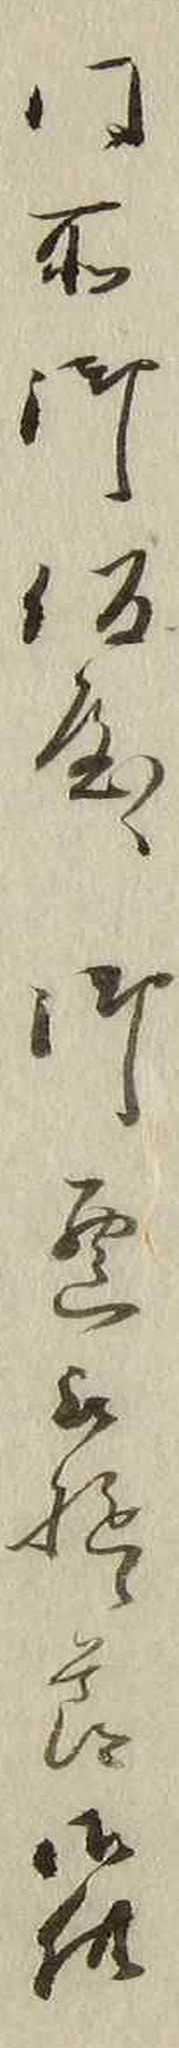同所御仮屋へ御遷被遊候節御供
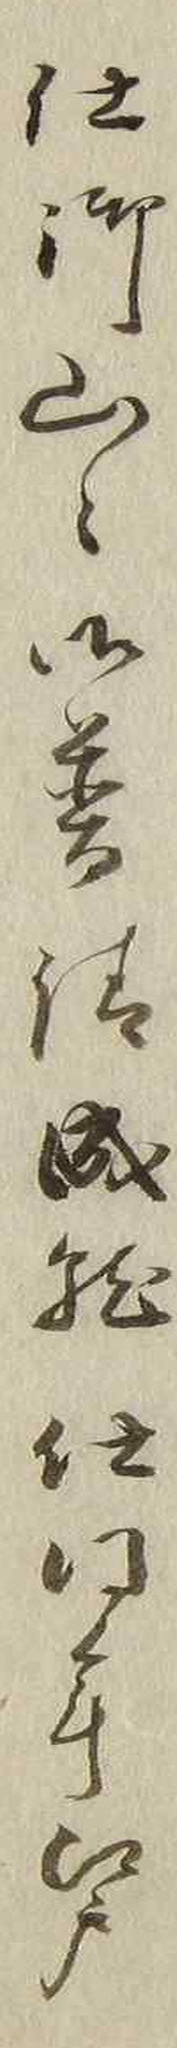仕御山々御普請成就仕同年江戸
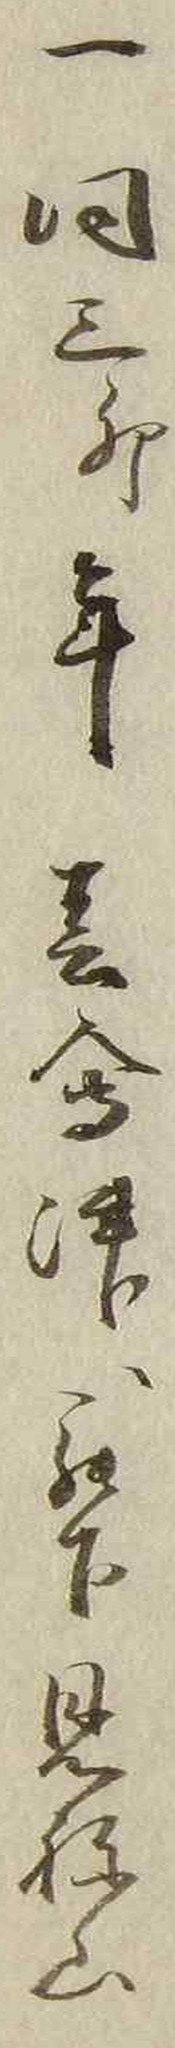一同三卯年春会津へ罷下見祢山
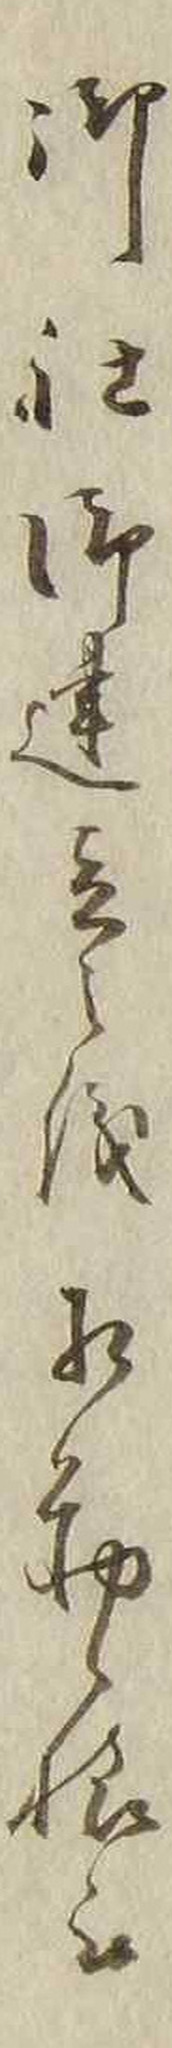御社御建立之儀相勤候様被

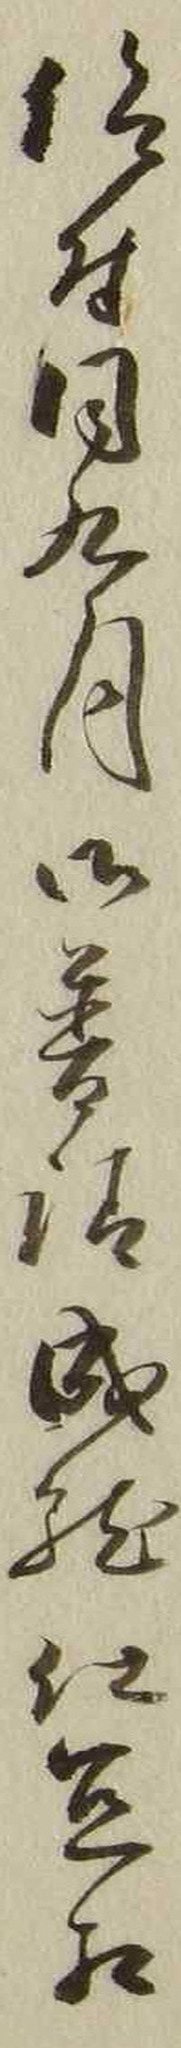仰付同九月御普請成就仕宜相
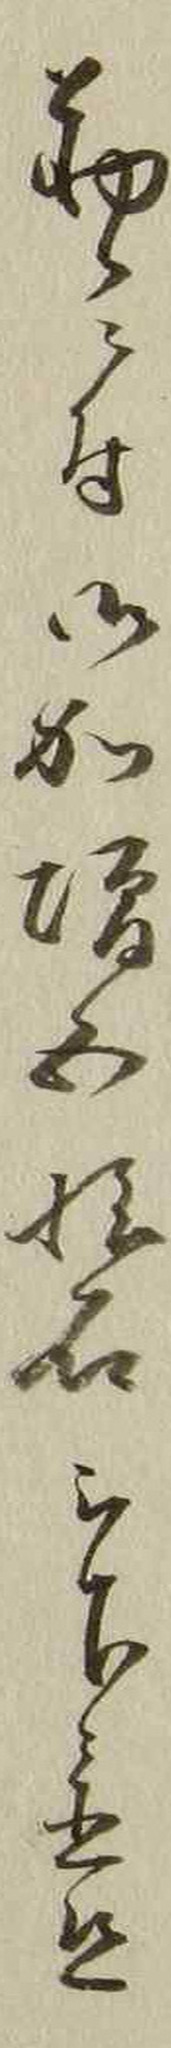勤候ニ付御加増五拾石被下置且
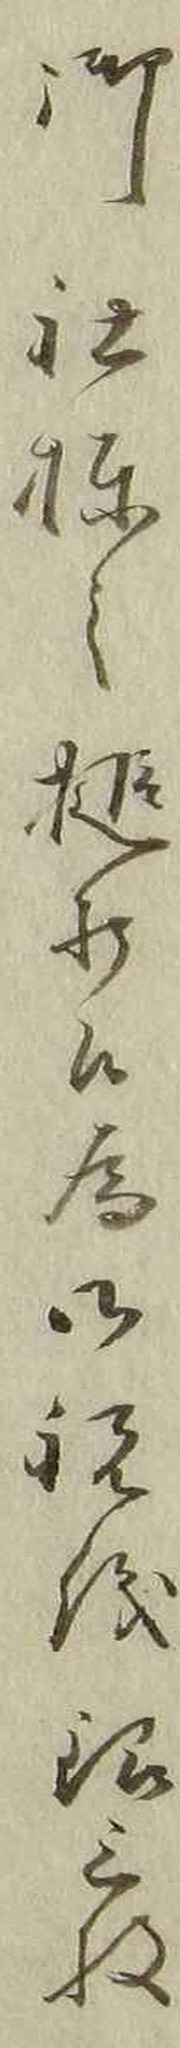御社棟之槌打候為御祝儀銀三枚
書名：諸士系譜　巻之28　い之部28
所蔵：会津若松市立会津図書館
